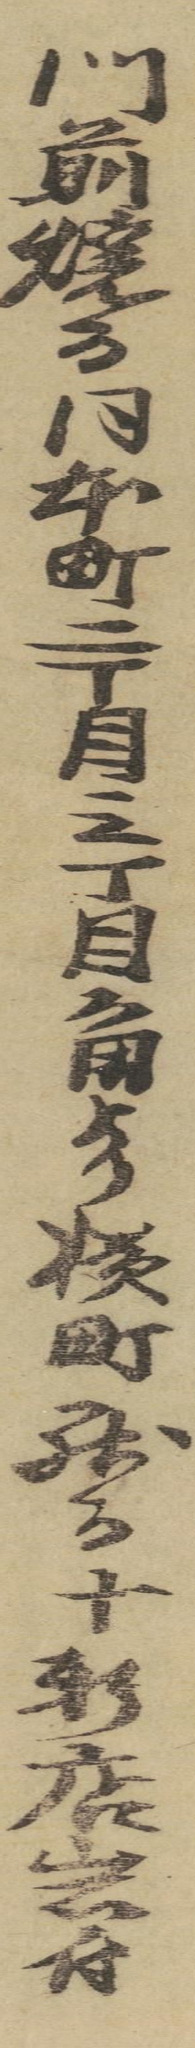門前焼る同本町二丁目三丁目角より横町残る十軒店岩付
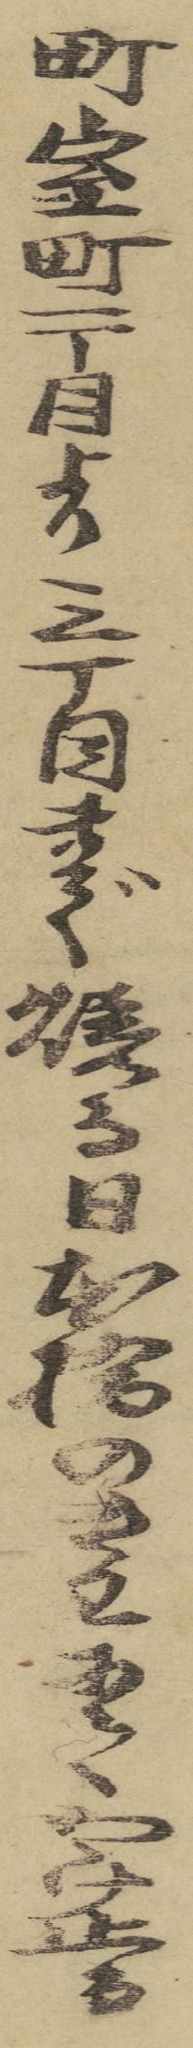町室町一丁目より三丁目まで焼る日本橋のきわにてやけ止る
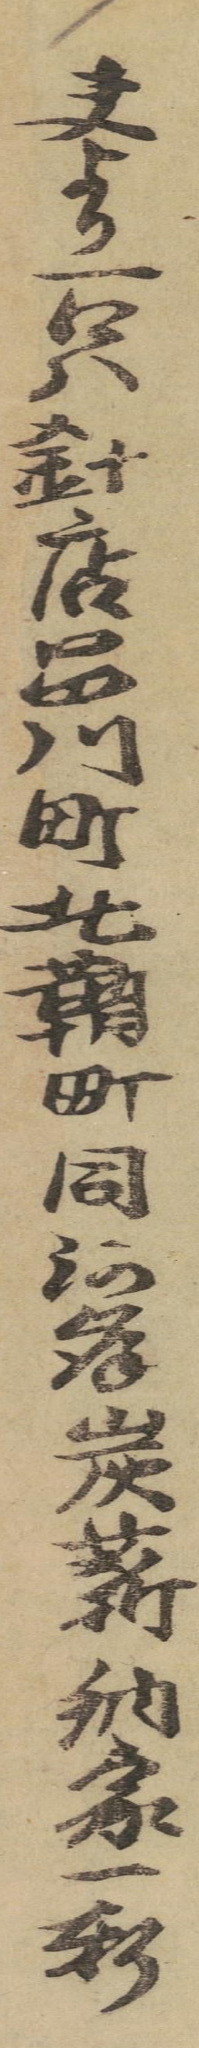夫より一口ハ針店品川町北鞘町道河岸薪納屋一軒
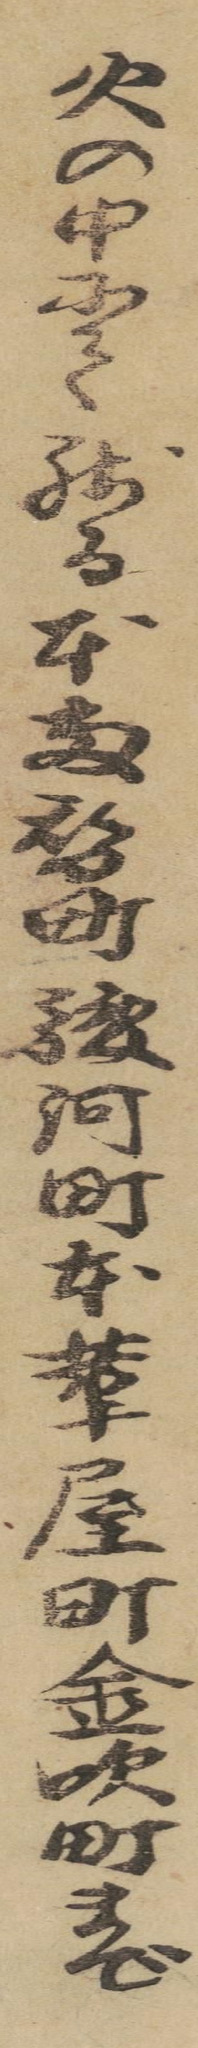火の中にて残る本両替町駿河町本革屋町金吹町まで
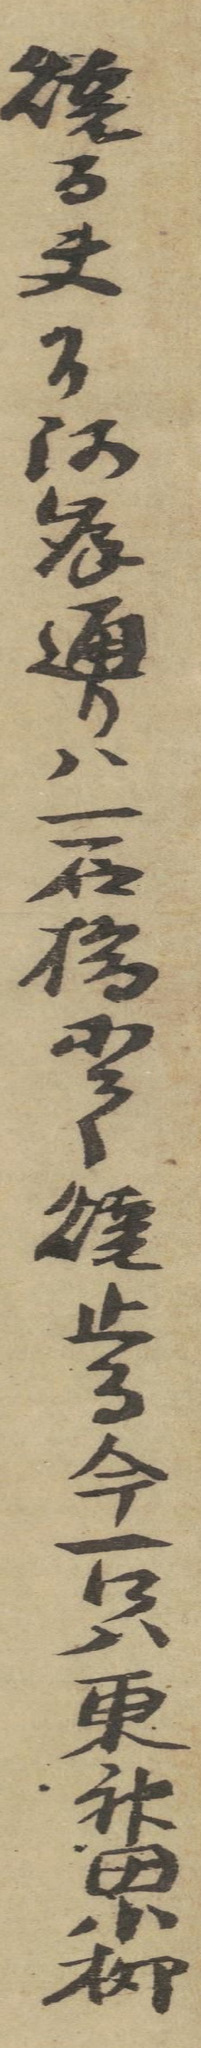焼る夫より河岸通りハ一石橋にて焼止る今一口ハ東神田小柳
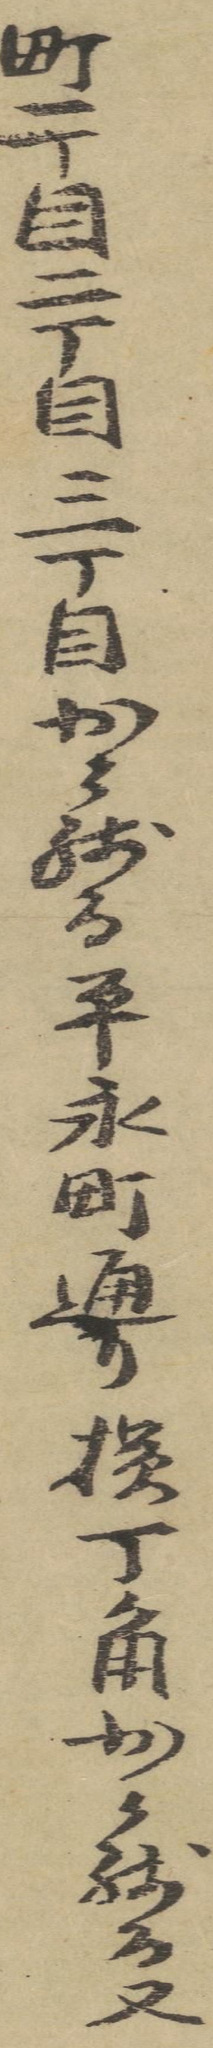町一丁目二丁目三丁目少々残る平永町通り横丁角少々残る又
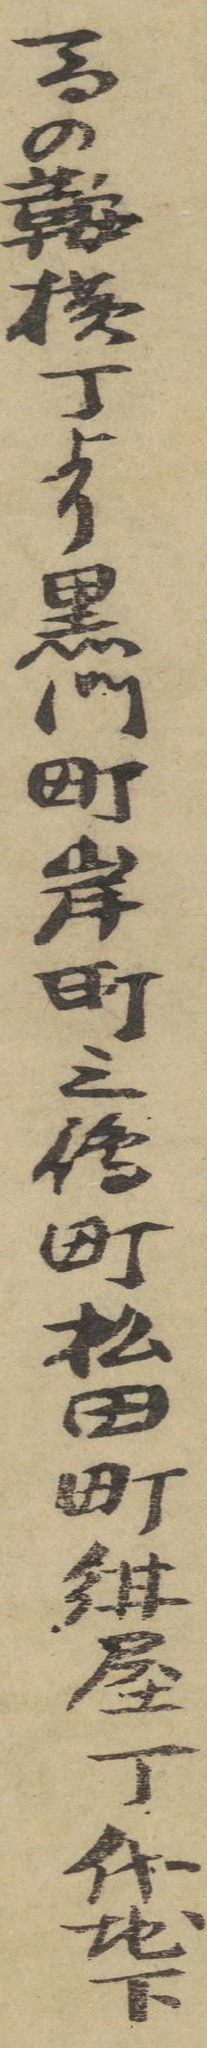馬の鞍横丁より黒門町岸町三嶋町松田町紺屋丁代地下
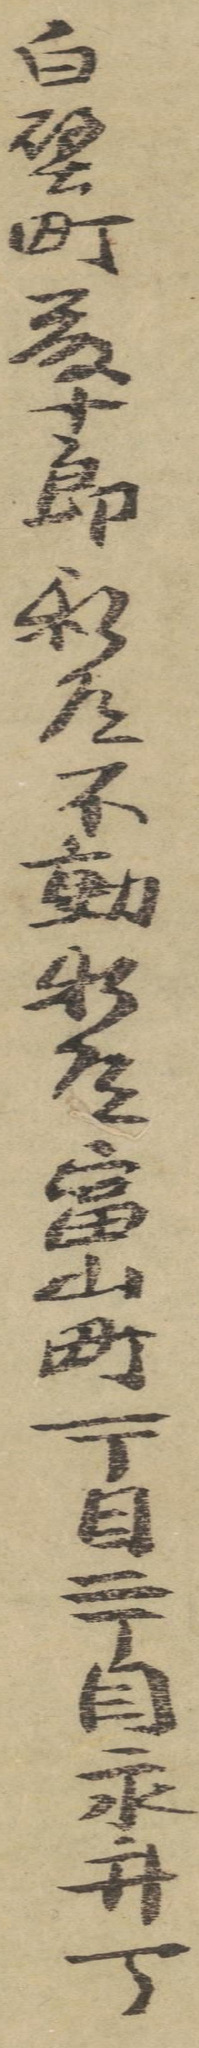白壁町藤十郎新道不動新道富山町一丁目二丁目永井丁
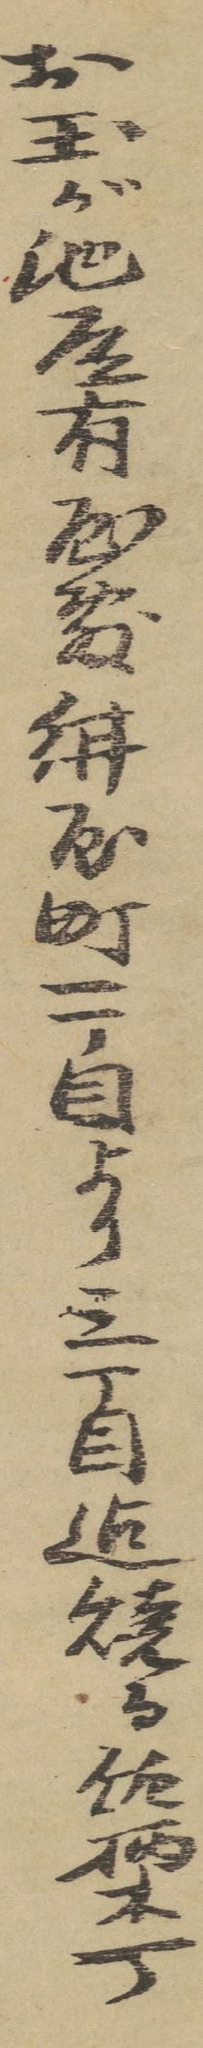お玉が池道有屋敷紺屋町一丁目より三丁目迄焼る佐柄木丁
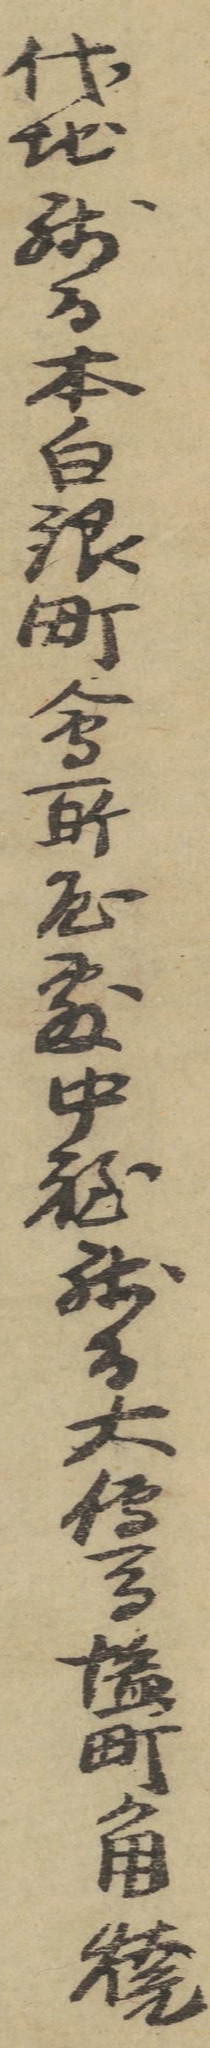代地残る本白銀町会所屋敷中程残る大伝馬塩町角焼
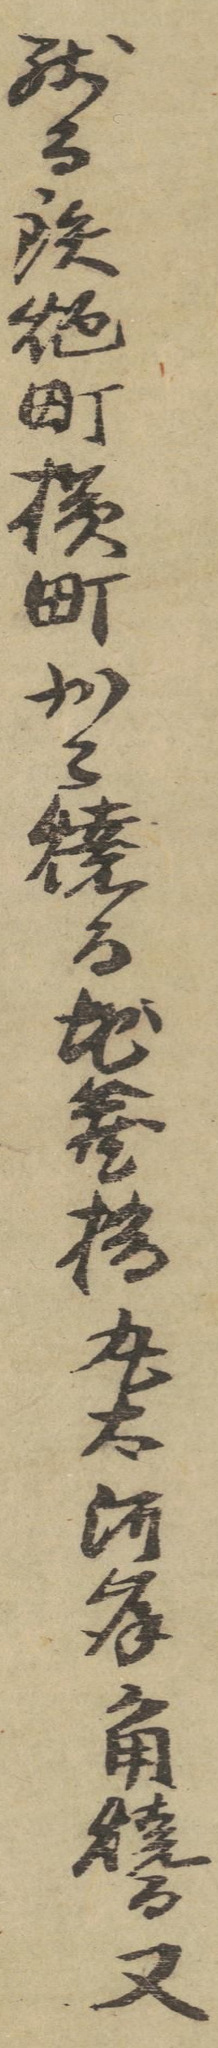残る鉄砲町横町から焼る地蔵橋丸太河岸角焼る又
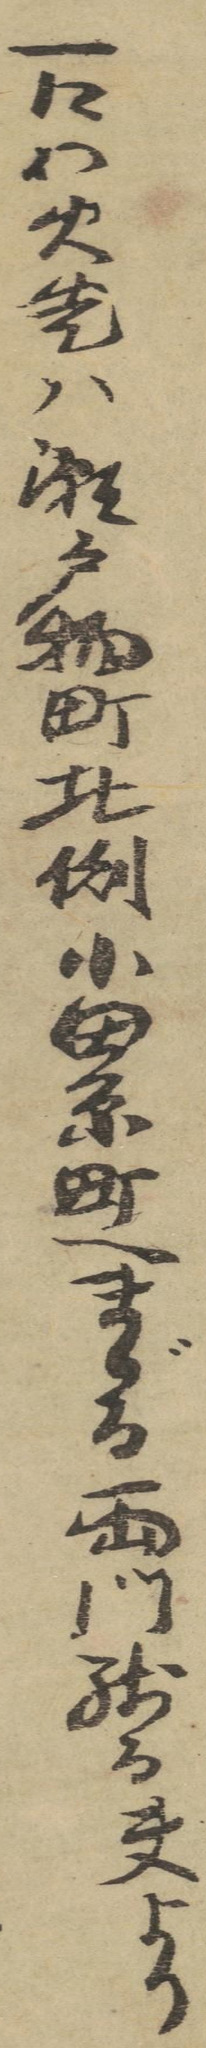一口ハ火先ハ瀬戸物町北側小田原町へまがる両門残る夫より
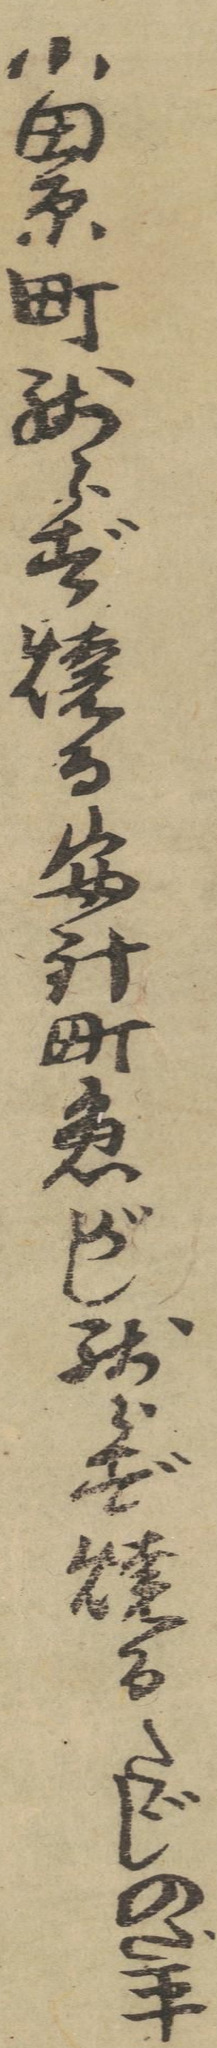小田原町残らず焼る安針町魚河岸残らず焼るたゞしのた平
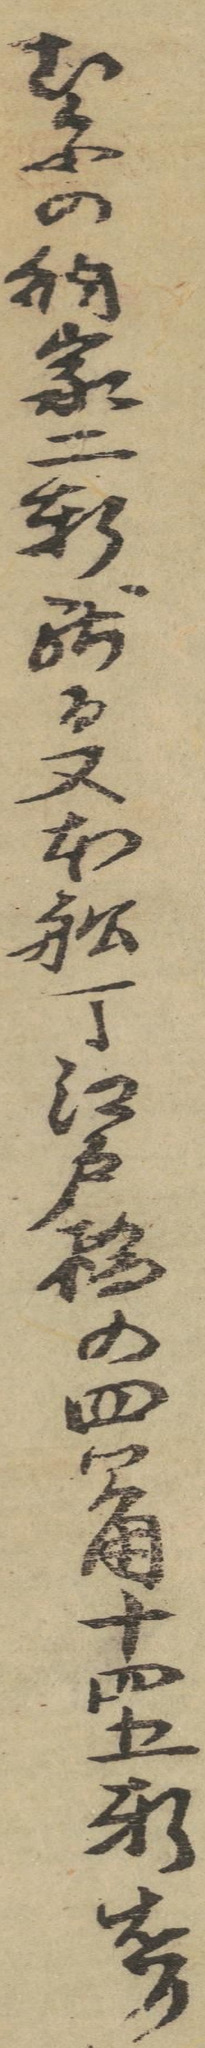むねの納屋二軒残る又本船丁江戸橋の四ツ角十四五軒をり
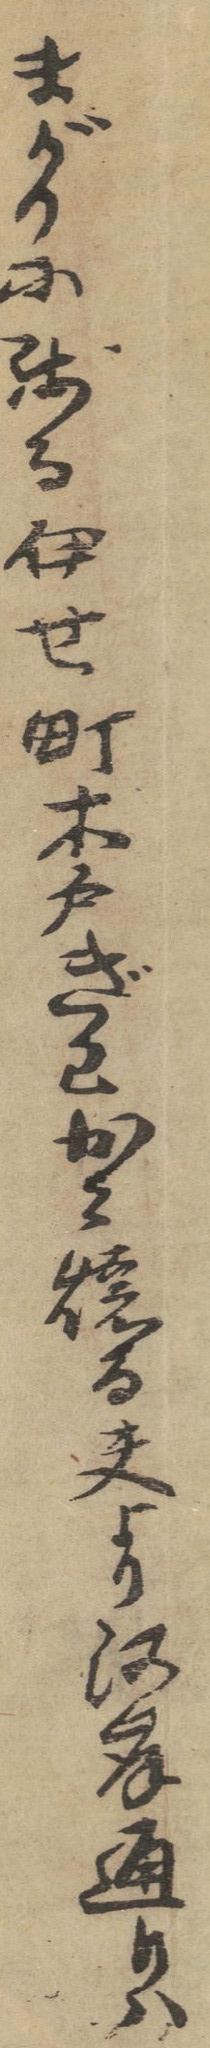まがりに残る伊せ町木戸ぎわ少々焼る夫より河岸通りハ
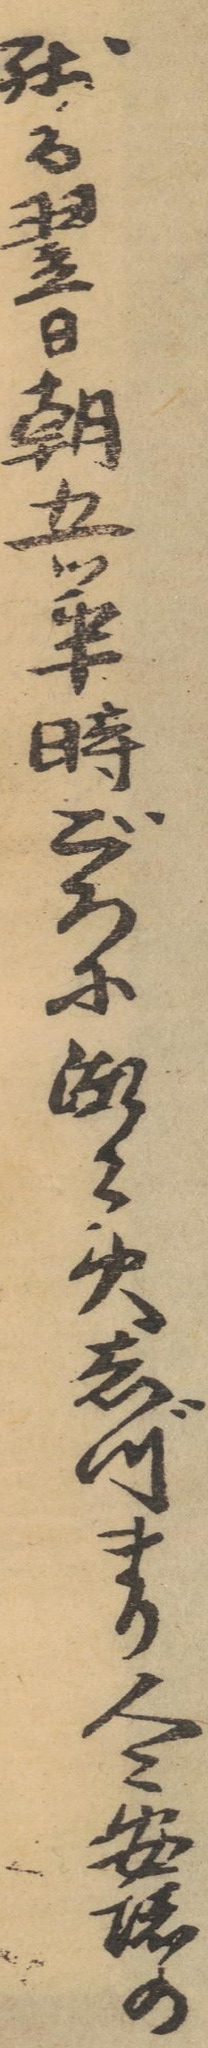残る翌日朝五ツ半時ごろに漸く火しづまり人々安堵の
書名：[安政元年十二月の江戸大火に関する瓦版]
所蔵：東京大学地震研究所図書室 Earthquake Research Institute Library, The University of Tokyo, JAPAN
